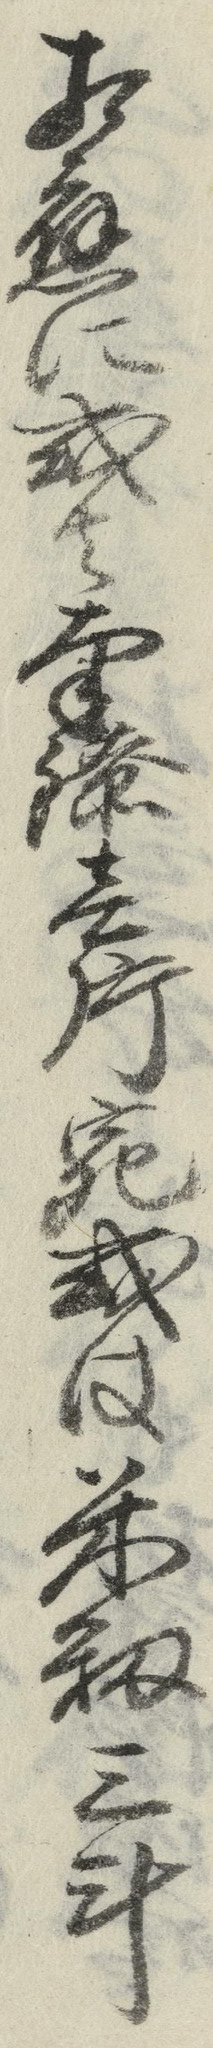相応に或は南鐐壱片宛或は米籾三斗
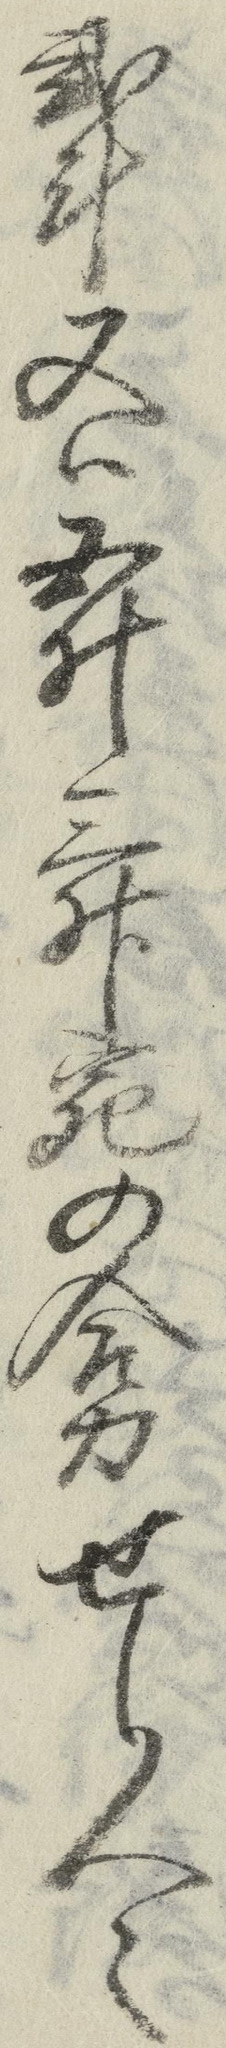弐斗又は五升三升宛の合力せし人々
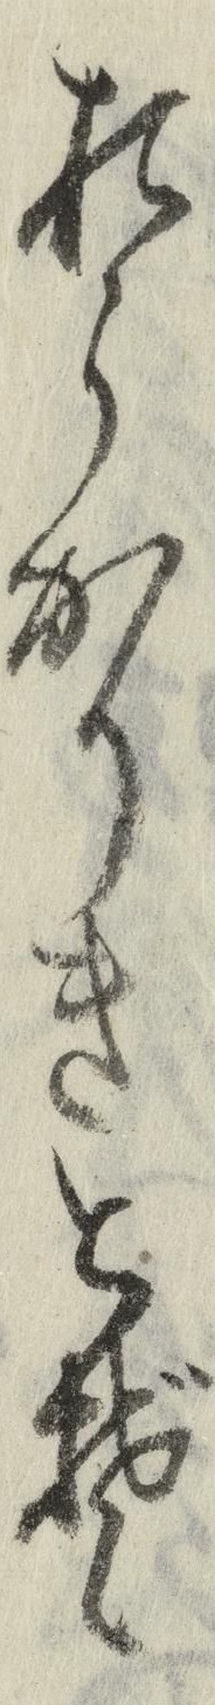おうかりきぞ
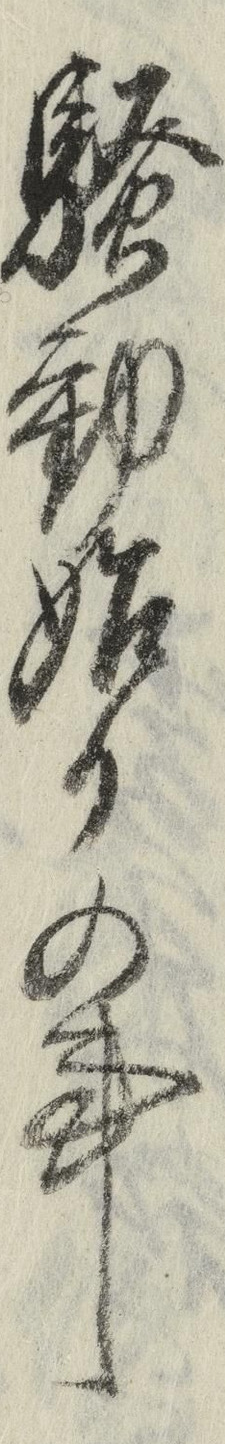騒動始りの事
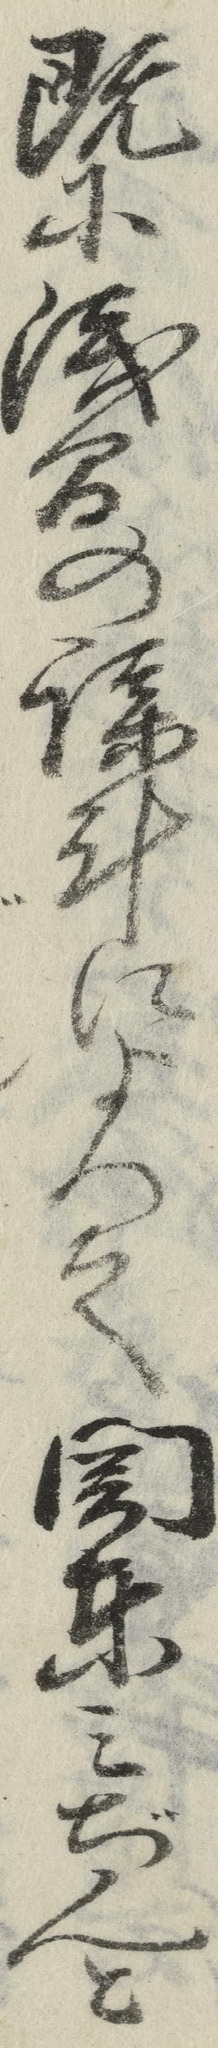既に浅間の謀計によつて関東みぢんと
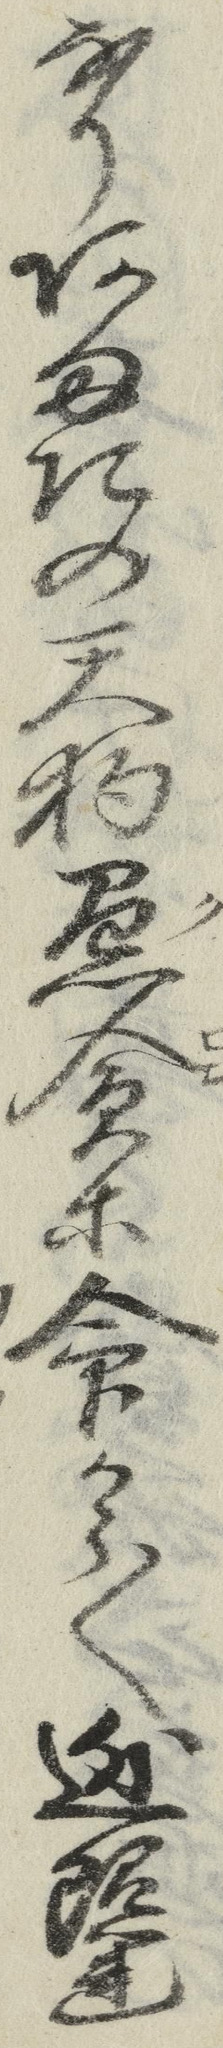なりあまたの天狗愚貧等命から〳〵逃隠れ
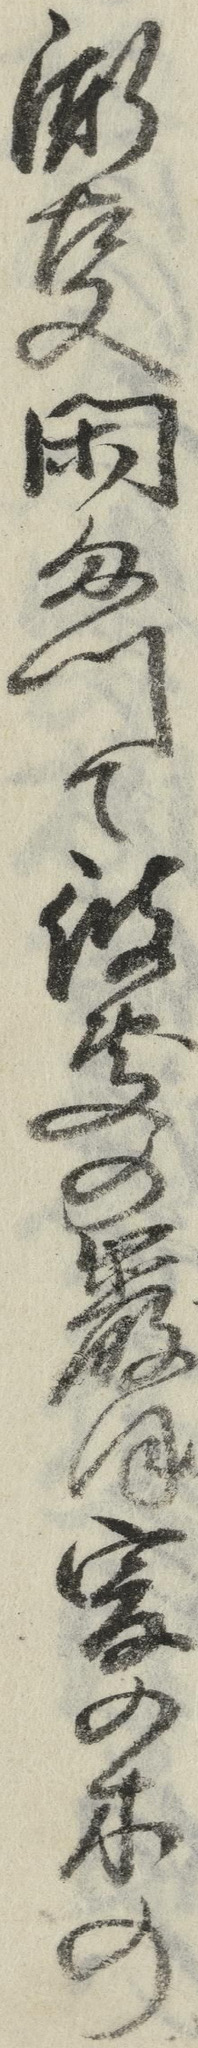漸事閑まつて彼処の巌保爰の木の

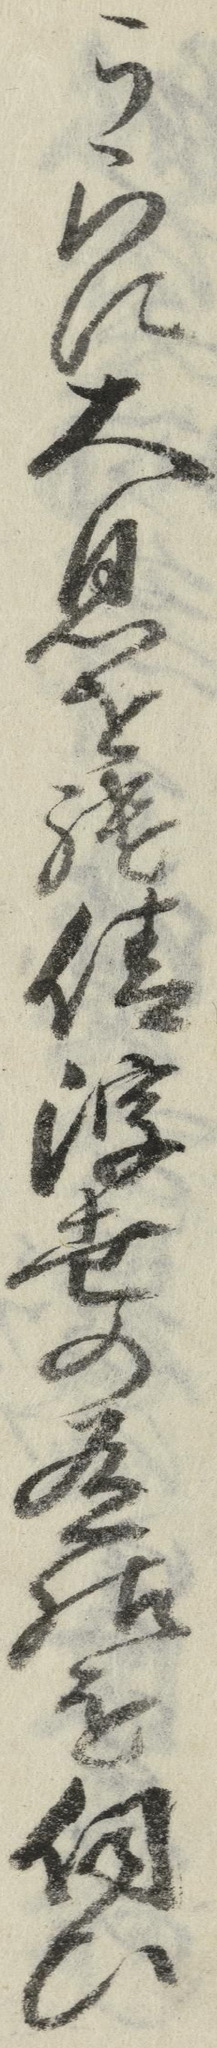うらに大息を継倩浮世の有様を伺ひ
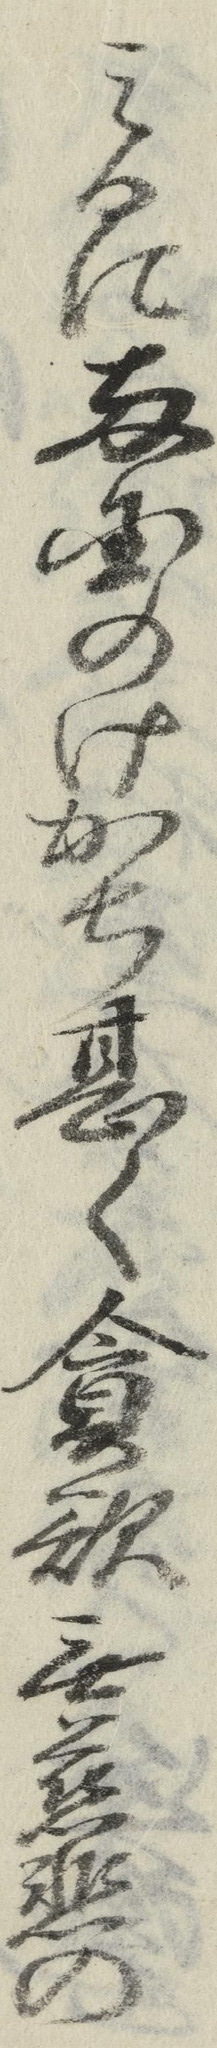みるに両国のけかち甚く貪欲無慈悲の
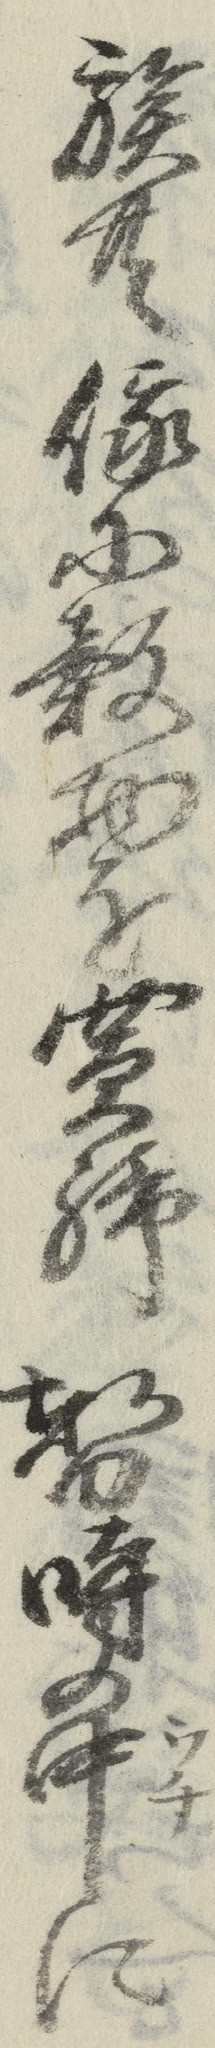族共俄に穀物を買締暫時の中に
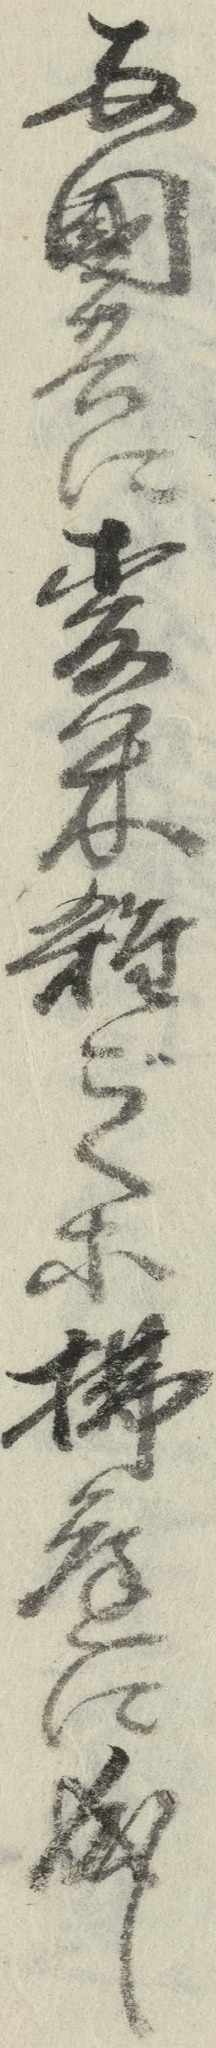両国共に麦米雑ごく等払底に成し
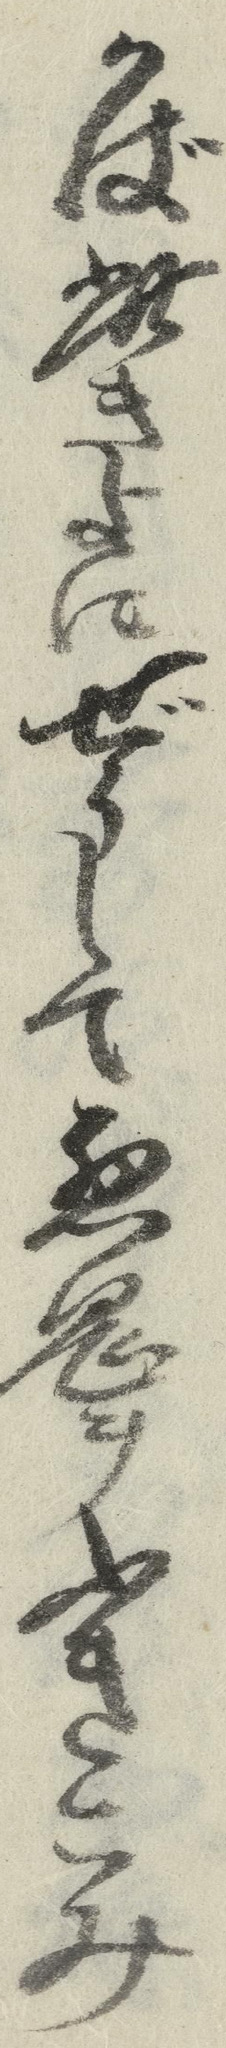かば此きよにぜらして悪鬼ヲふきこみ
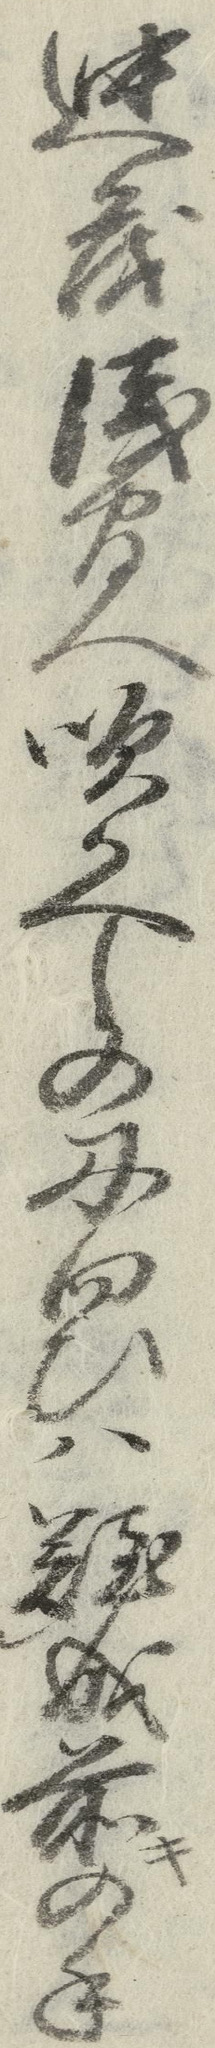迚も浅間へ吹かへしの刃向ひは難成前手
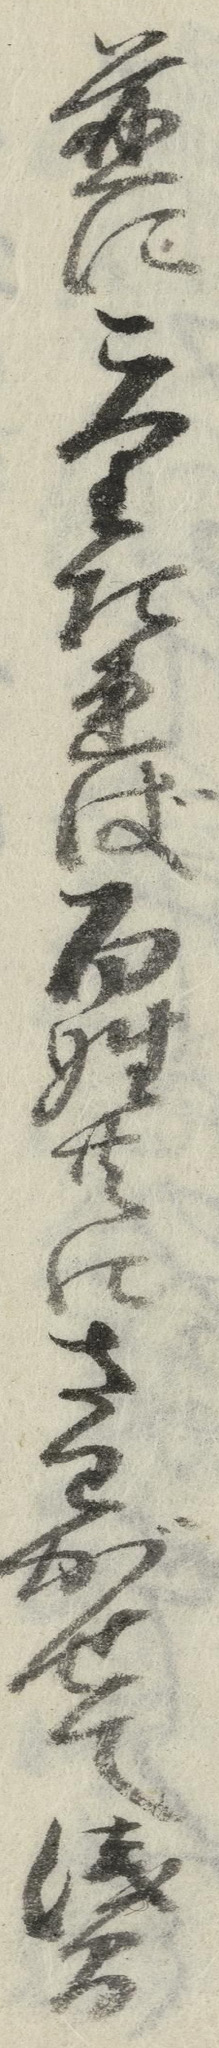並にこりたれば百姓共にさわがせて浅間
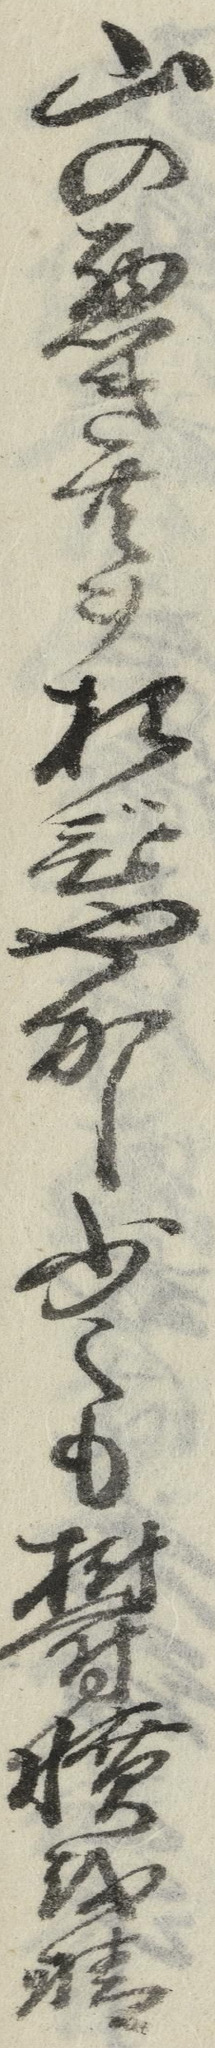山の悪き共ヲおびやかし少〻も鬱憤を晴
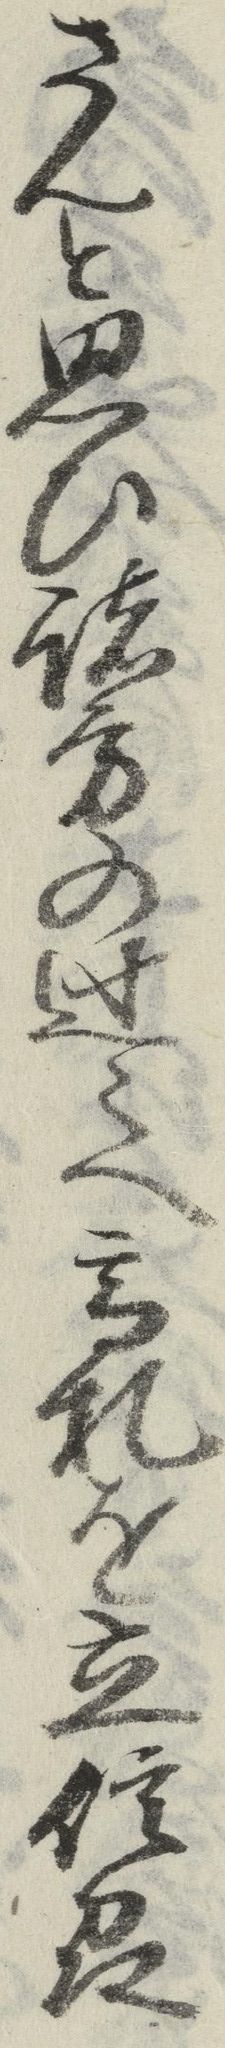さんと思ひ諸方の辻々へ高札を立信州
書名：浅間大焼騒動記　中
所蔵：東京大学地震研究所図書室 Earthquake Research Institute Library, The University of Tokyo, JAPAN
